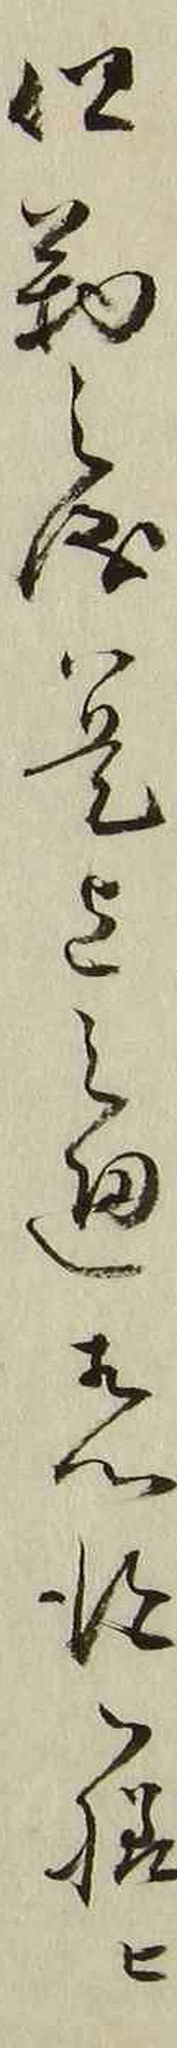但勤之儀ハ是迄之通相心得候様被
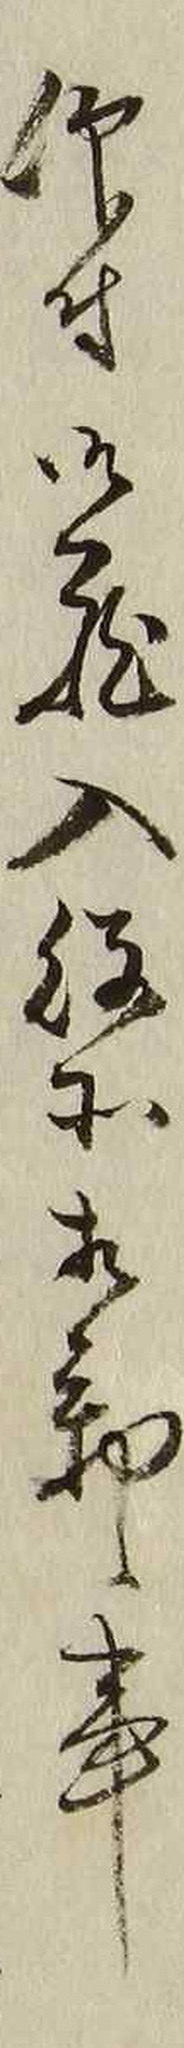仰付御蔵入役所相勤候事
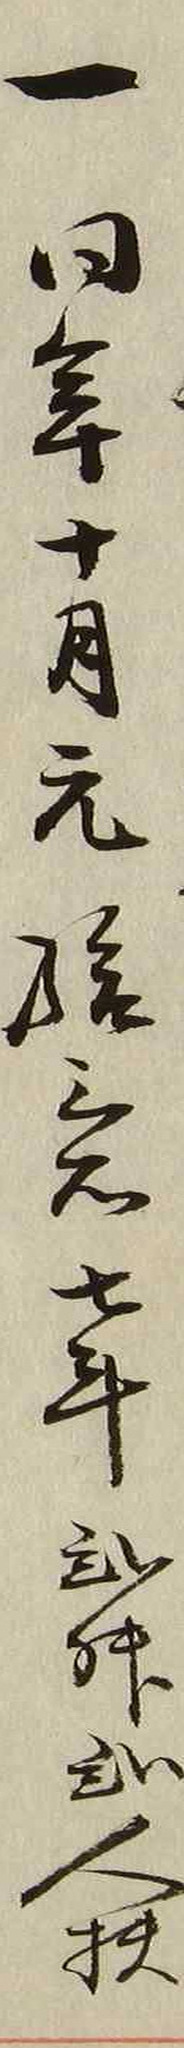一同年十月元拾三石七斗弐升弐人扶
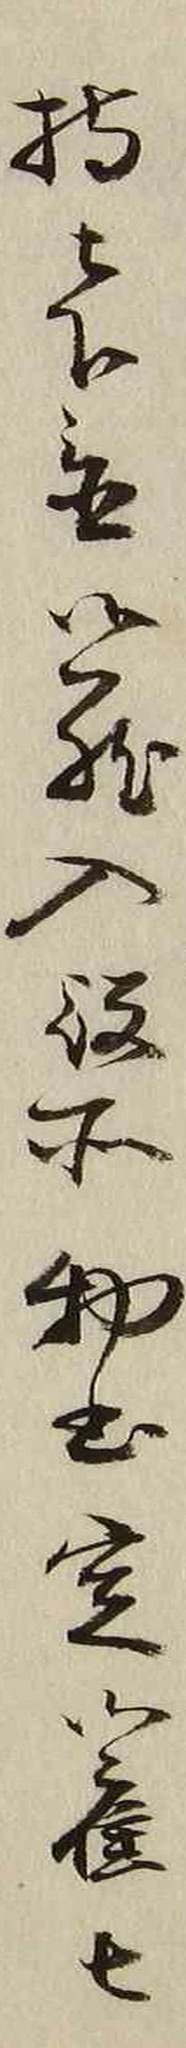持被下置御蔵入役所物書定御雇被
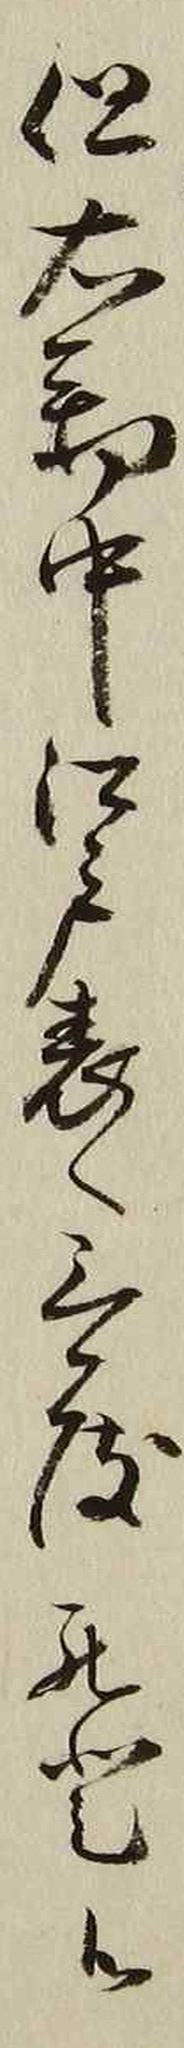但右勤中江戸表へ三度罷登候
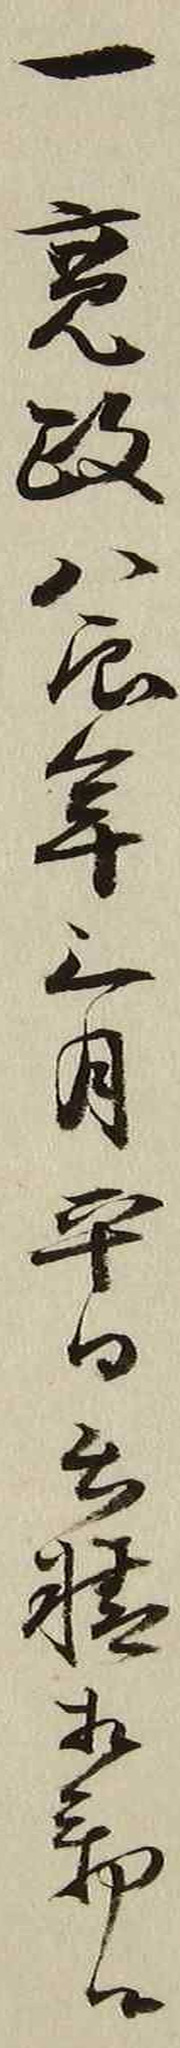一寛政八辰年三月平日出精相勤候
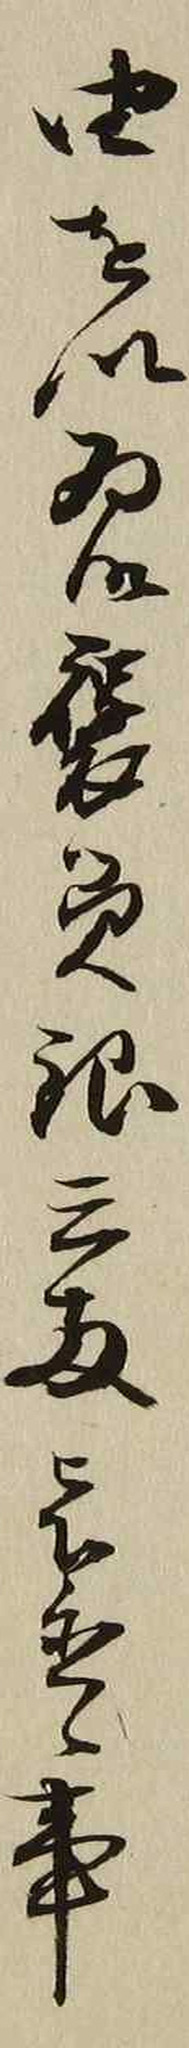由を以為御褒美銀三両被下置候事
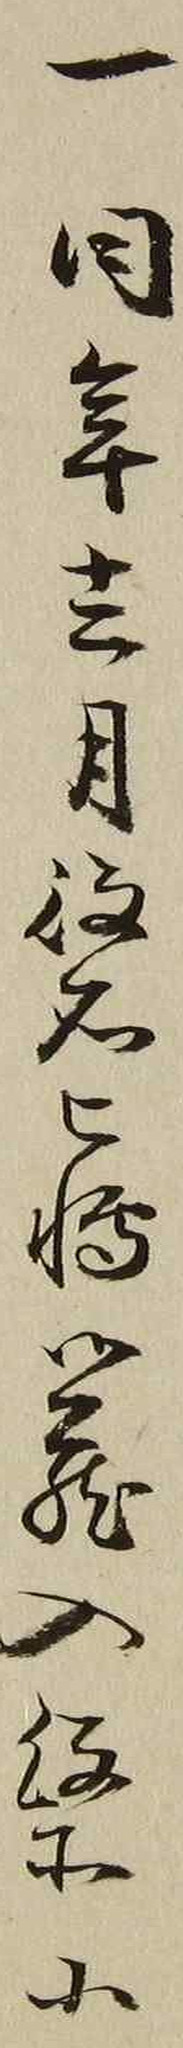一同年十二月役名被転御蔵入役所小
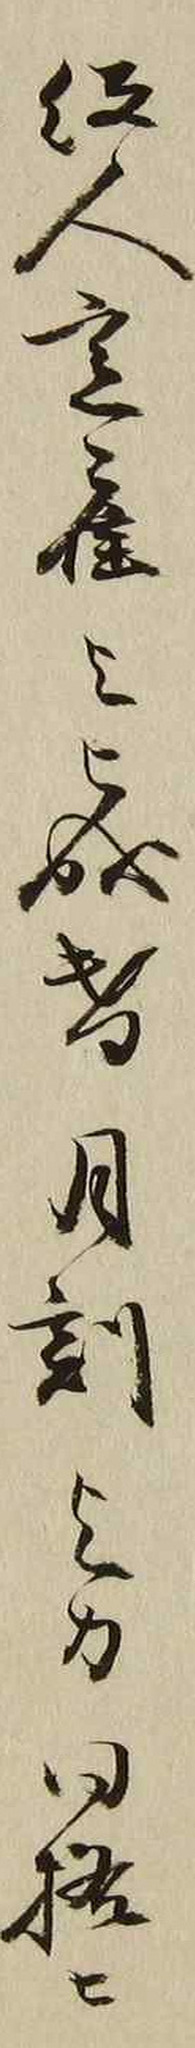役人定雇与被成替月割与力同格被
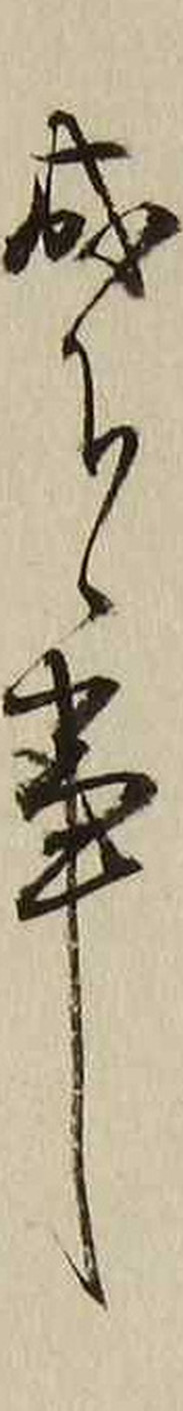成下候事
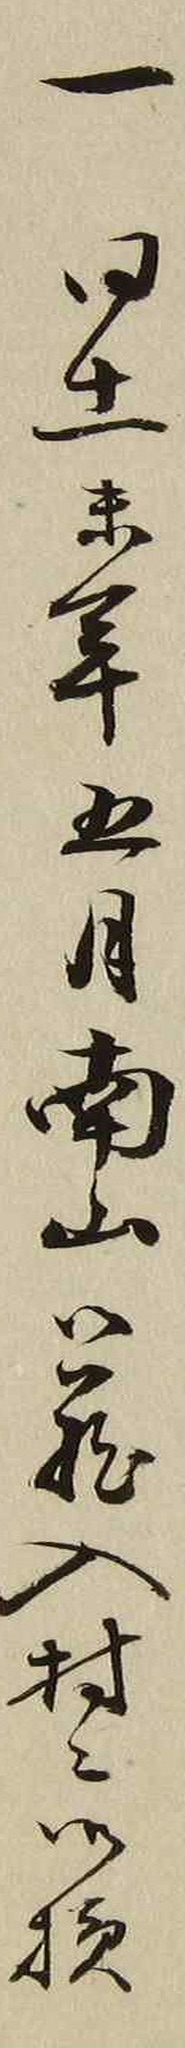一同十一未年五月南山御蔵入村々御損
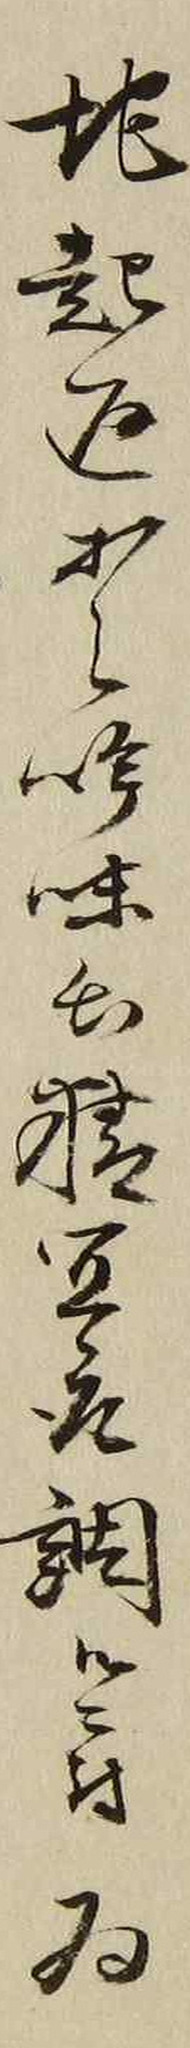地起返等之吟味出精宜取調候ニ付為
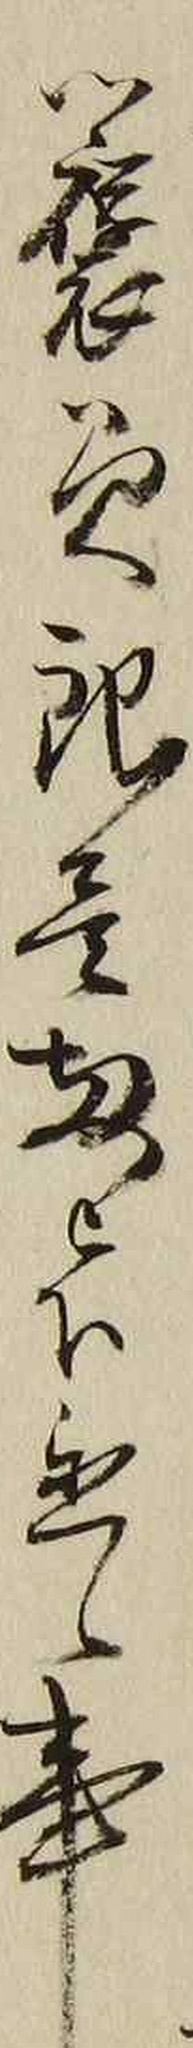御褒美銀壱両被下置候事
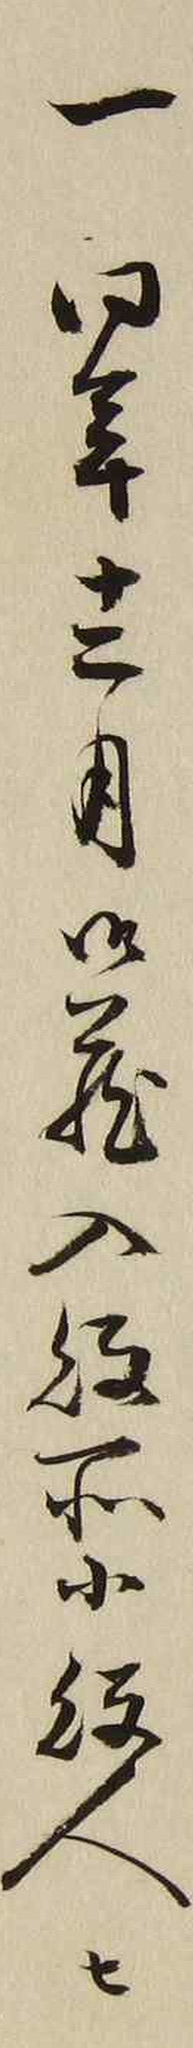一同年十二月御蔵入役所小役人被
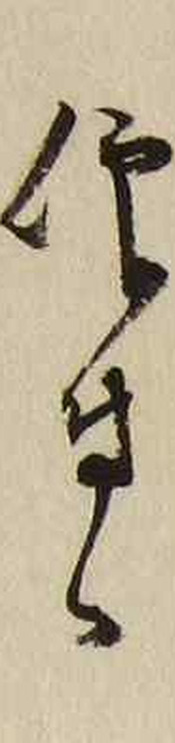仰付候
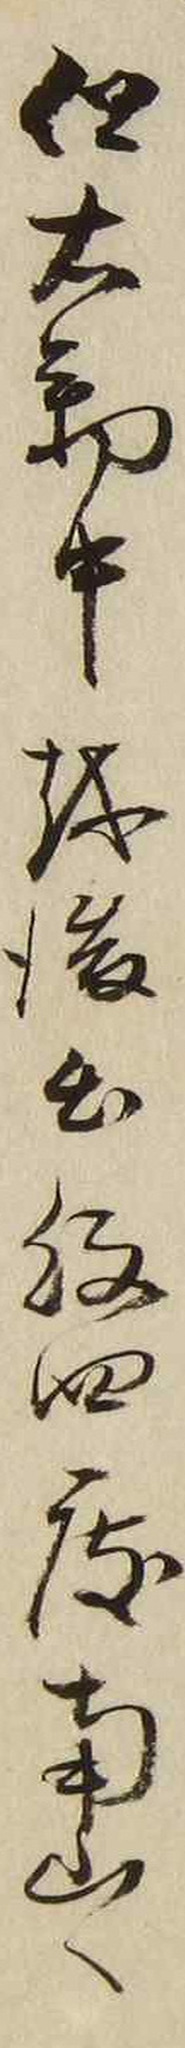但右勤中越後出役四度南山へ
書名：諸士系譜　巻之291　さ之部23
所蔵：会津若松市立会津図書館
